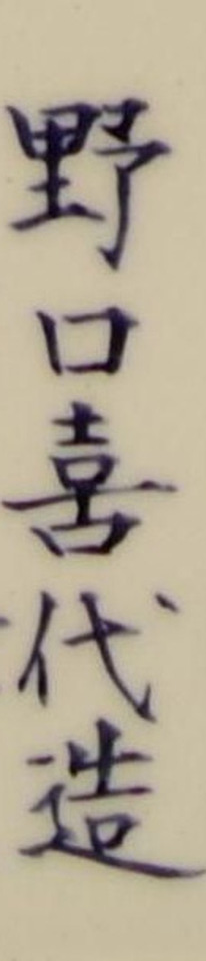野口喜代造
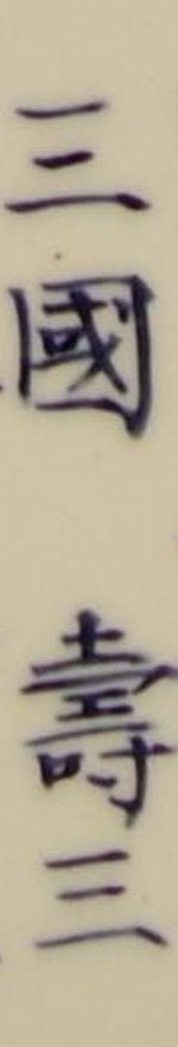三国壽三
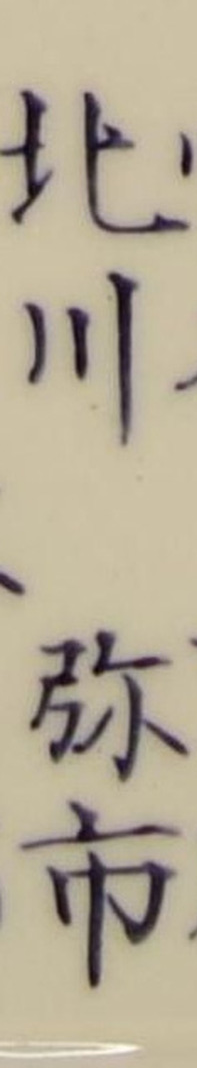北川弥市
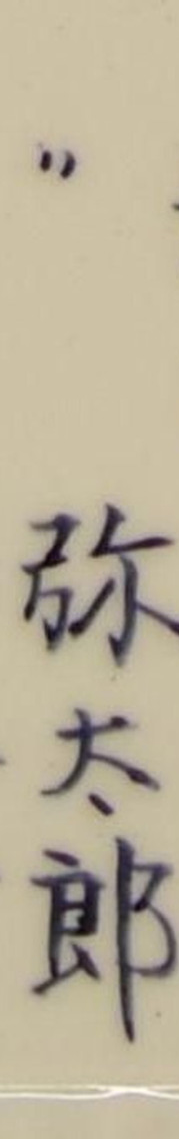弥太郎
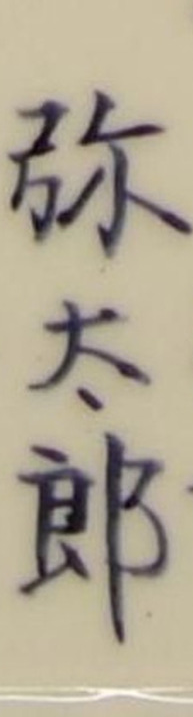弥太郎
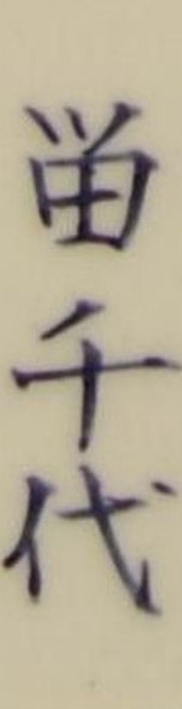留千代
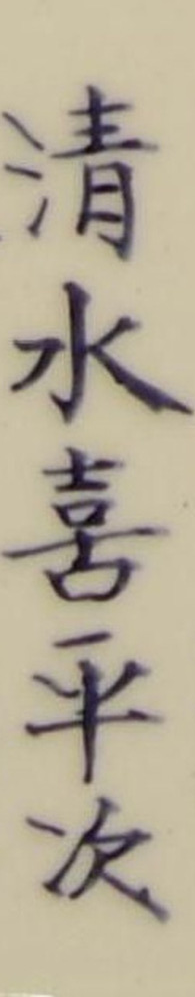清水喜平次
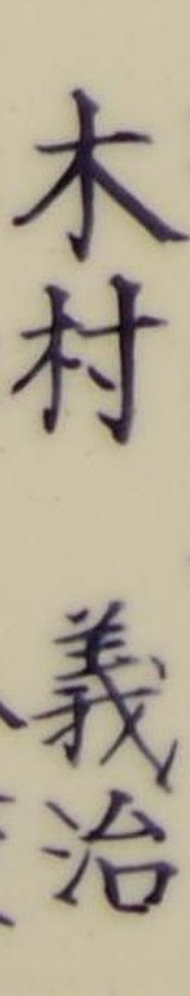木村義治
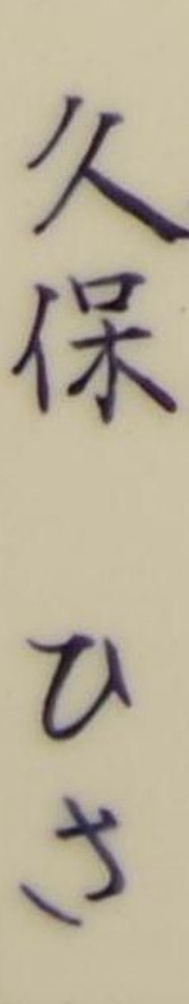久保ひさ

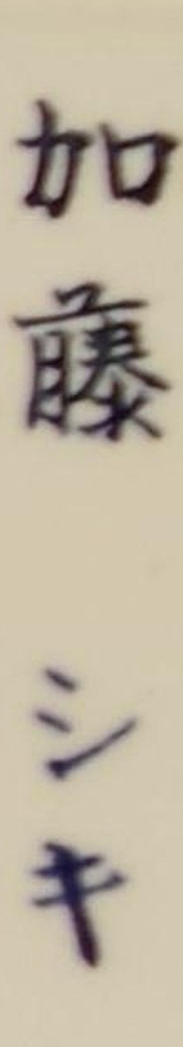加藤シキ
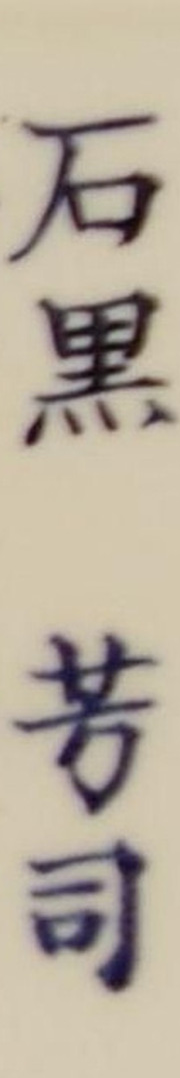石黒芳司
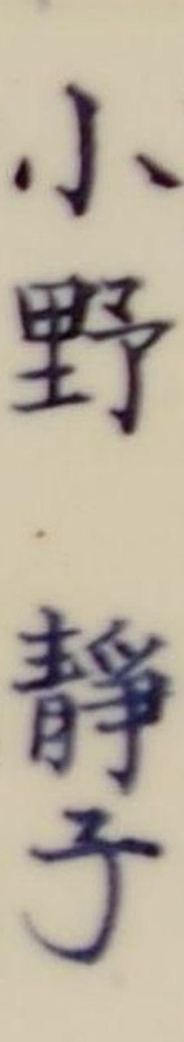小野静子
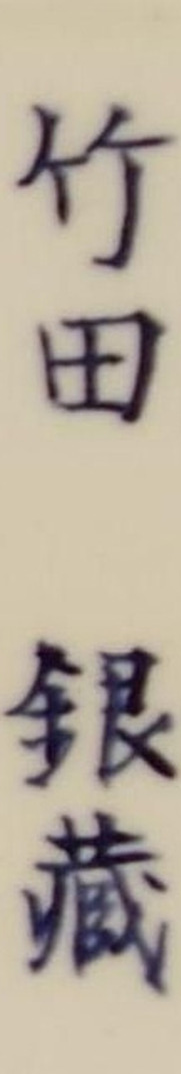竹田銀蔵
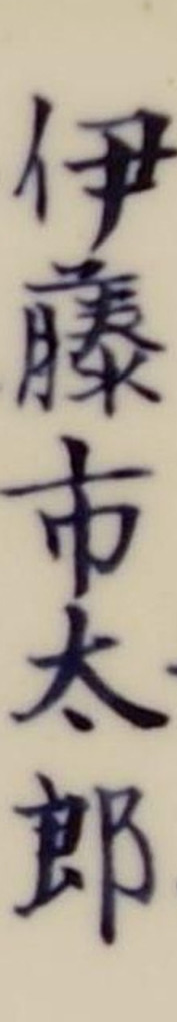伊藤市太郎
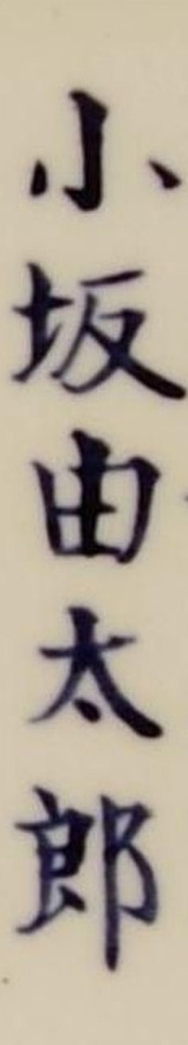小坂由太郎
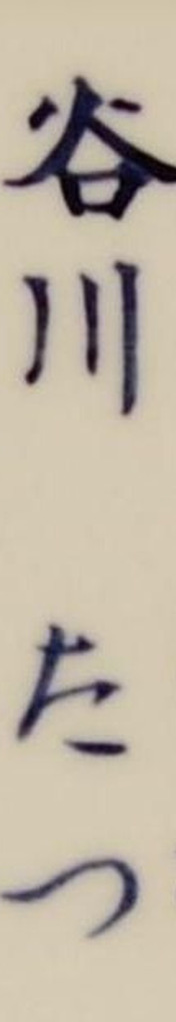谷川たつ
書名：E~L
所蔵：高野山金剛峯寺
